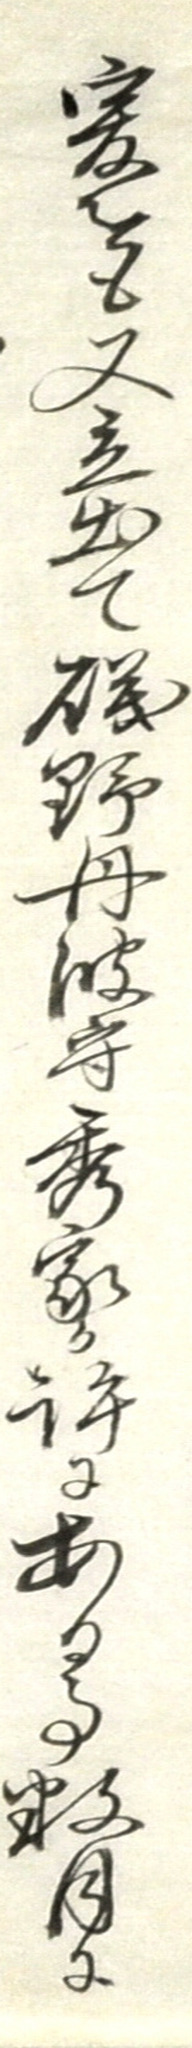爰をも又立出て磯野丹波守秀家か許にある事数月に
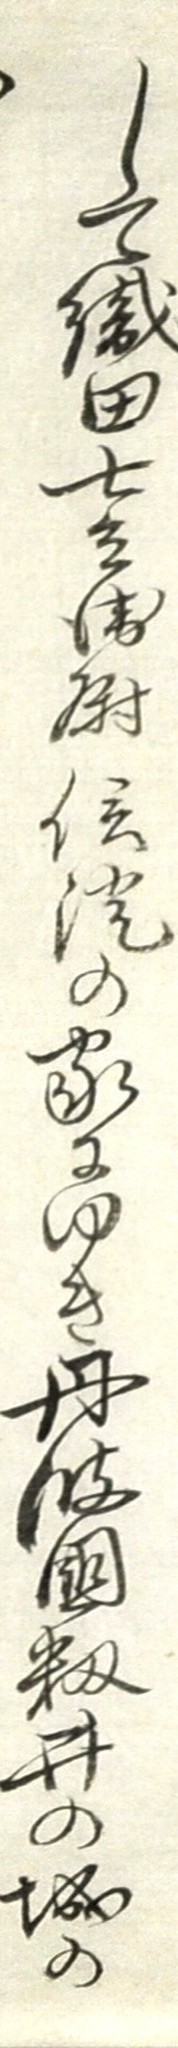して織田七兵衛尉信濃の家にゆき丹波国籾井の城の
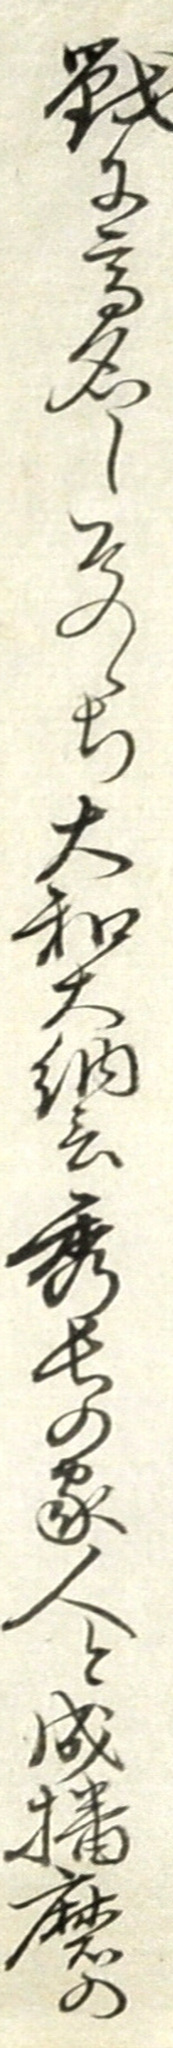戦に高名しそのゝち大和大納言秀長の家人と成播磨の
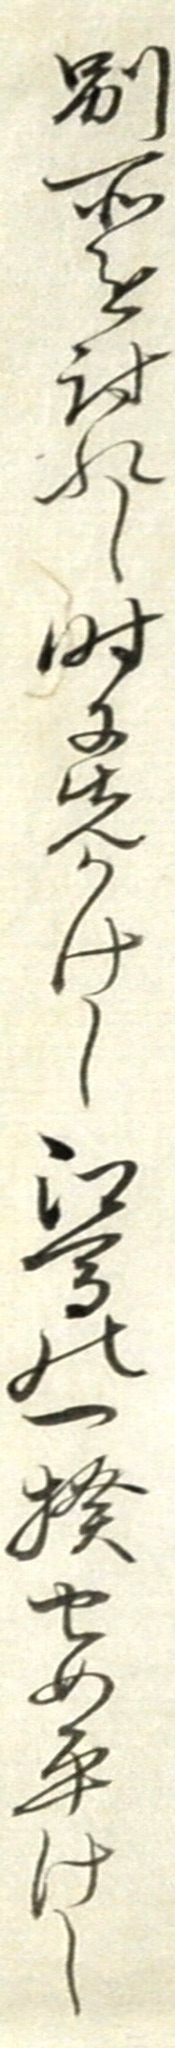別所を討れし時に先かけし江馬の一揆せめ平けし

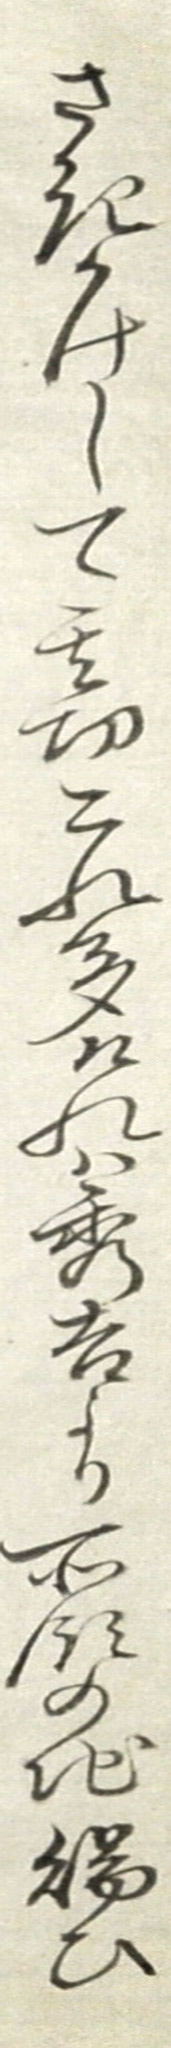さきかけして其功これ多けれは秀吉より所領の地賜ひ
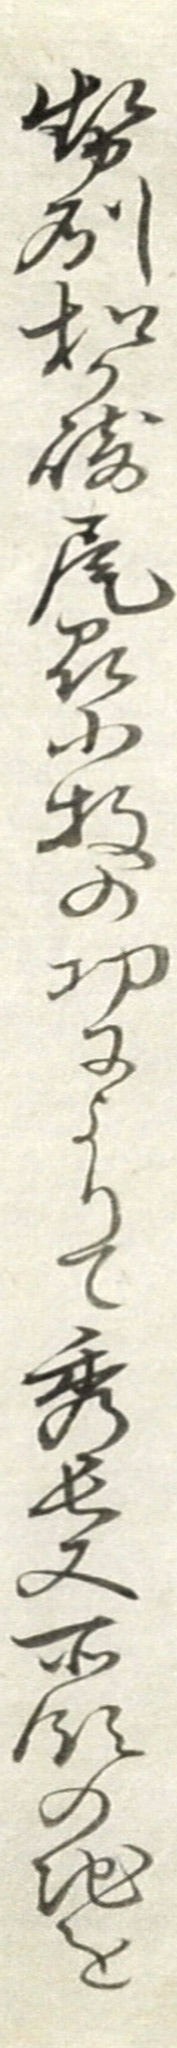勢州松か崎尾州小牧の功によりて秀長又所領の地を
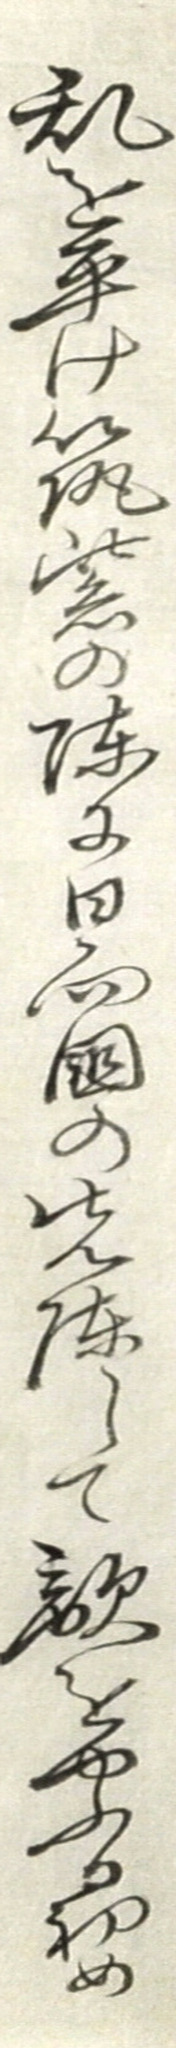乱を平け筑紫の陣に日向国の先陣して敵をやふる初め
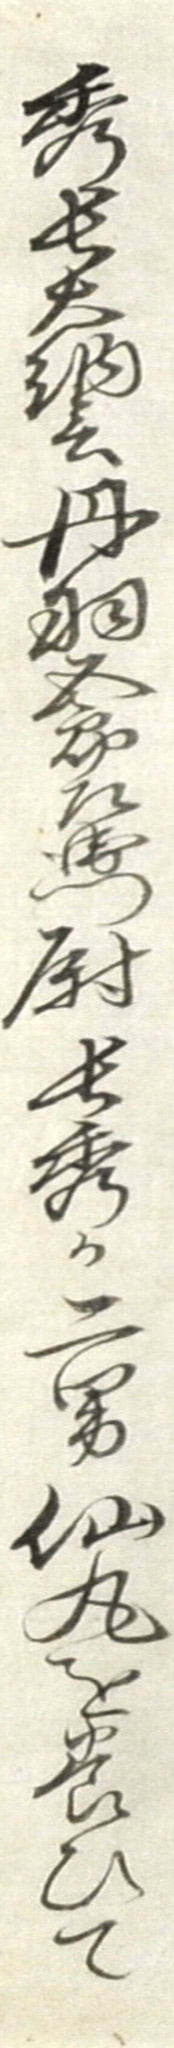秀長大納言丹羽五郎左衛門尉長秀か二男仙丸を養ひて
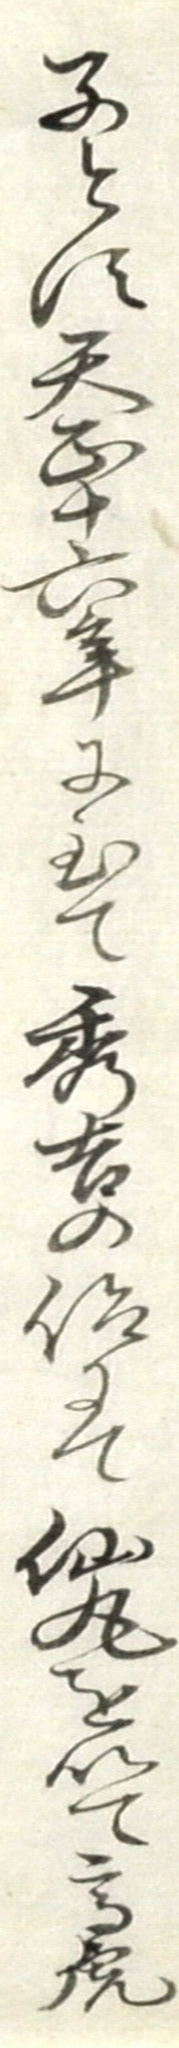子とす天正十六年に至て秀吉の仰にて仙丸を以て高虎
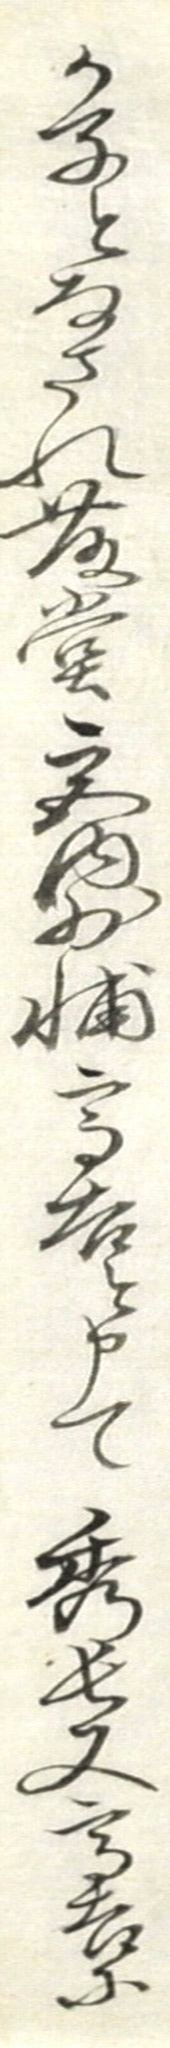か子となされ藤堂宮内少輔高吉と申て秀長又高吉に
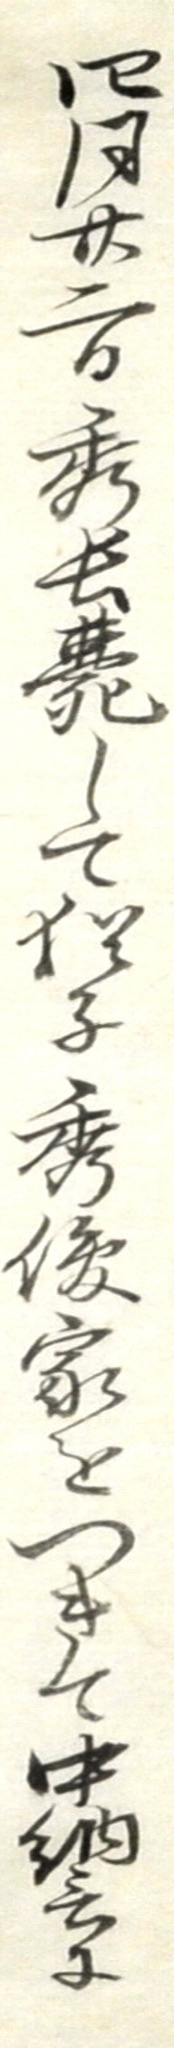四月廿二日秀長薨して猶子秀俊家をつきて中納言に
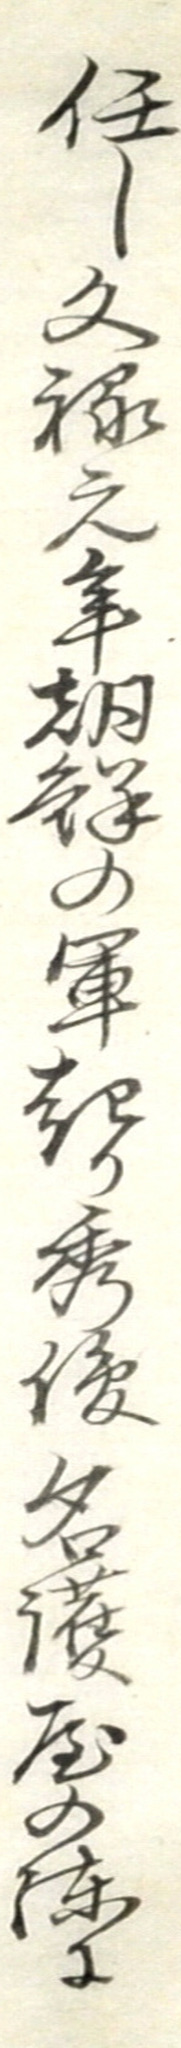任し文禄元年朝鮮の軍起り秀俊名護屋の陣に
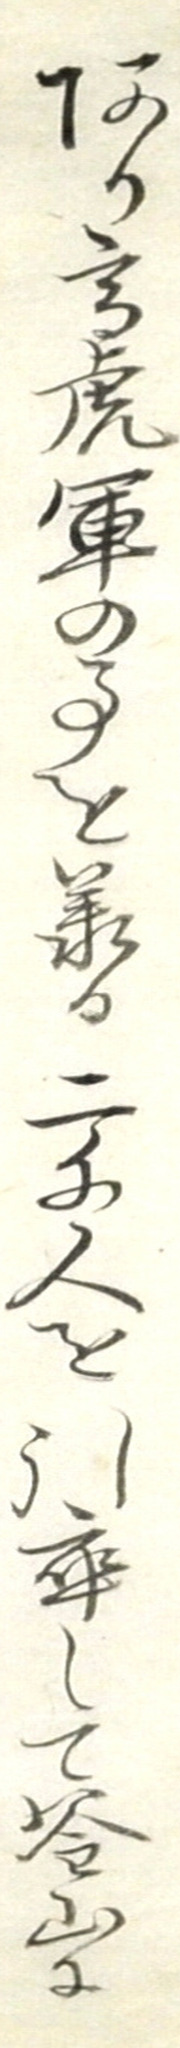あり高虎軍の事を承る二千人を引率して釜山に
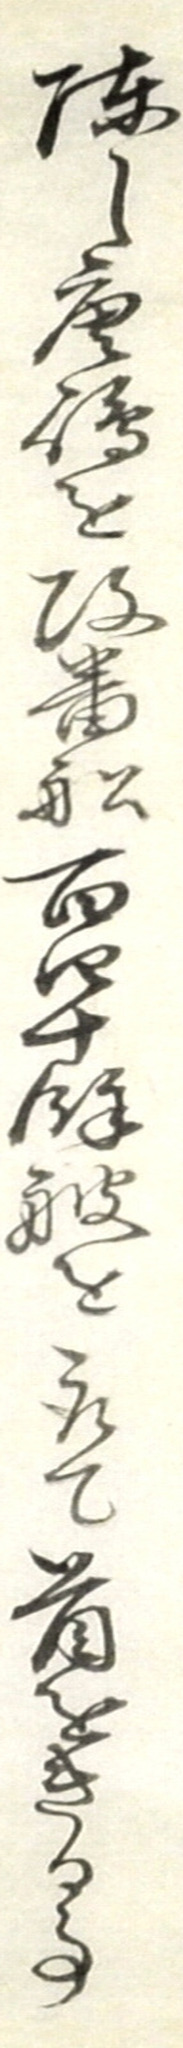陣し唐島を攻番船百四十余艘を取て首をきる事
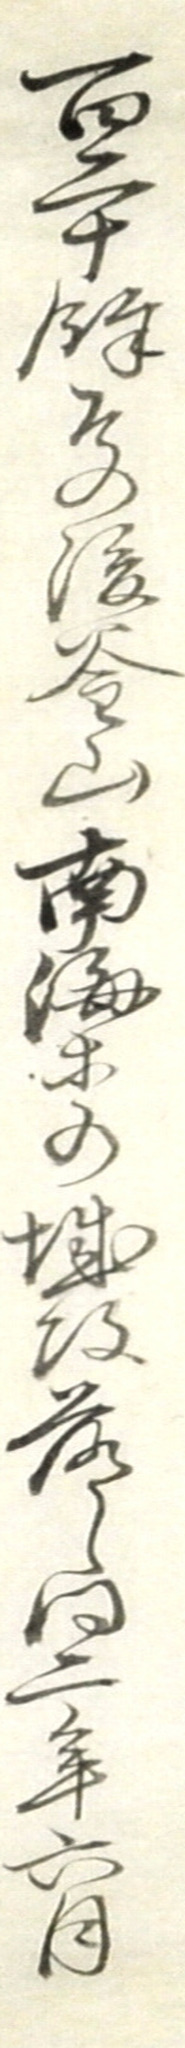百二十余その後釜山南海等の城攻落し同二年六月
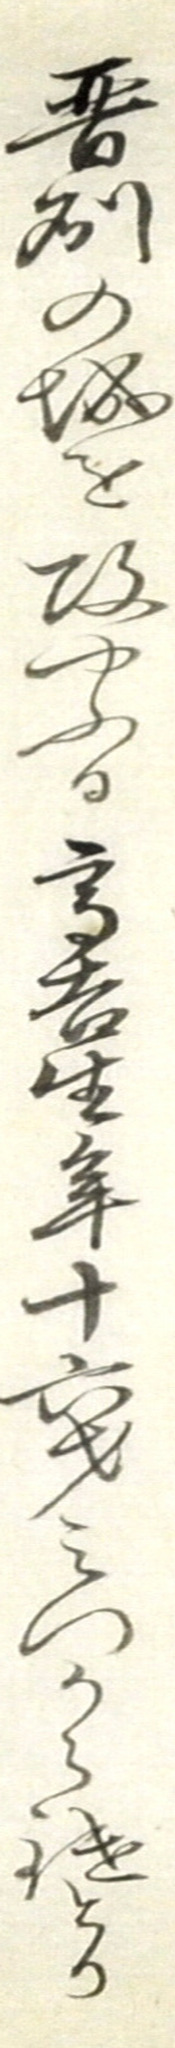晋州の城を攻やふる高吉生年十六才みつから鑓とり
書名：藩翰譜（七・下）
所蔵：伊那市立高遠町図書館・合同会社AMANE
